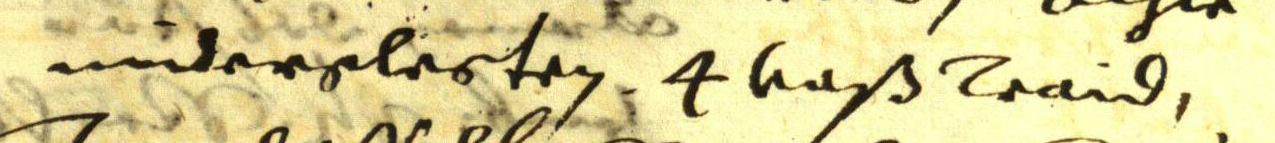niderglegten. 4 vaß Traid,
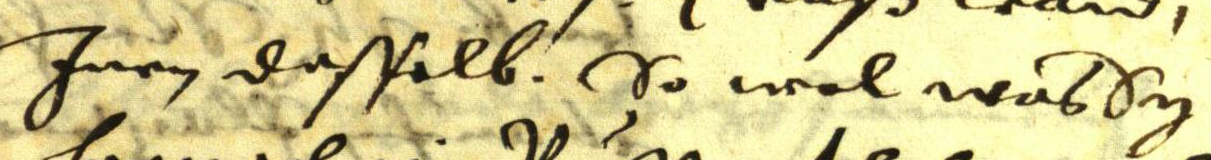Inen dasselb. So wol was Sȳ
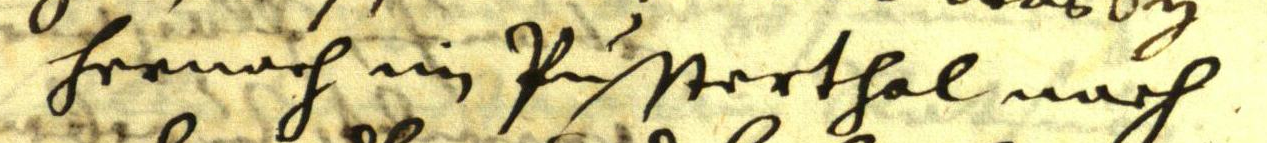hernach im Pūssterthal noch
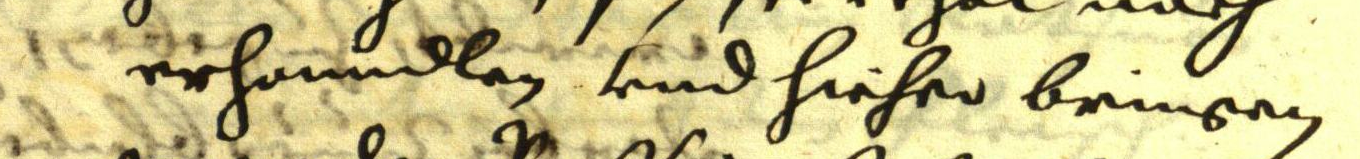erhanndlen vnd hieher bringen
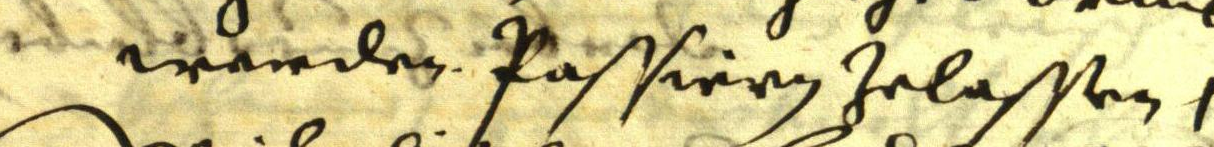werden. Passiern Zelassen,
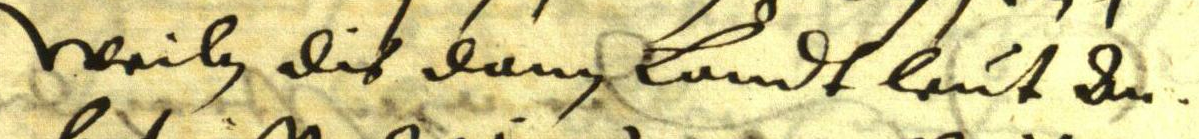Weiln dis dann Lanndtleūt An¬
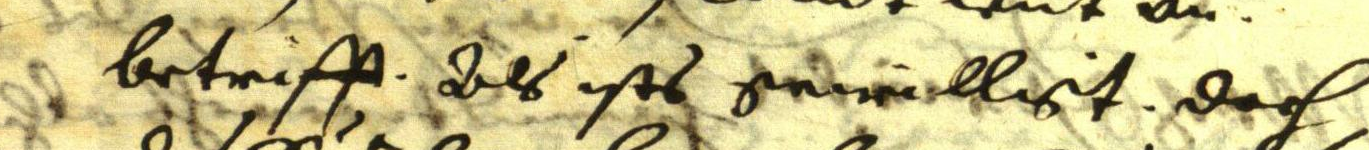betrifft. Als ists gewilligt. doch
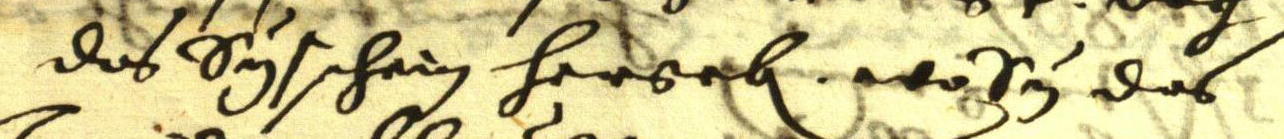das Sȳ schein hergeb. wo Sȳ das
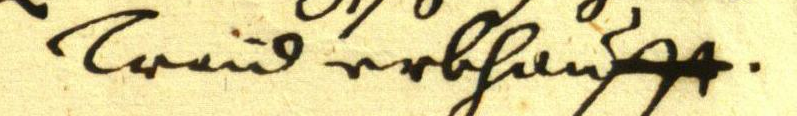Traid erkhaūfft.
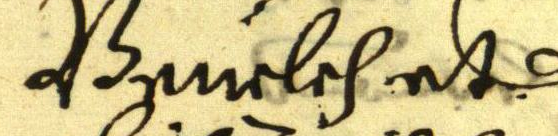Beūelch et¬
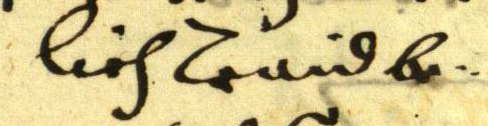lich Traid be¬
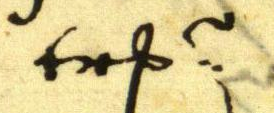tr:
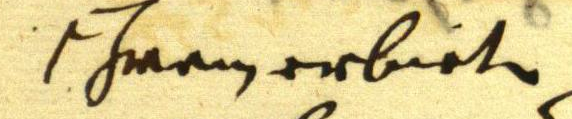Irem erbieten
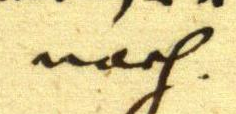nach.
